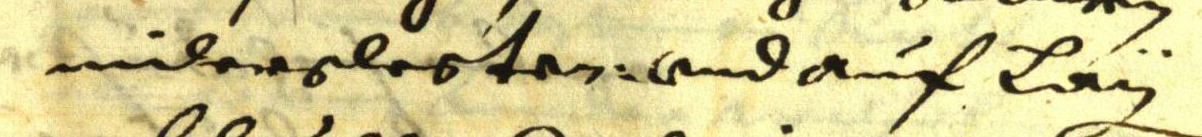niderglegten: vnd aūf Laÿ
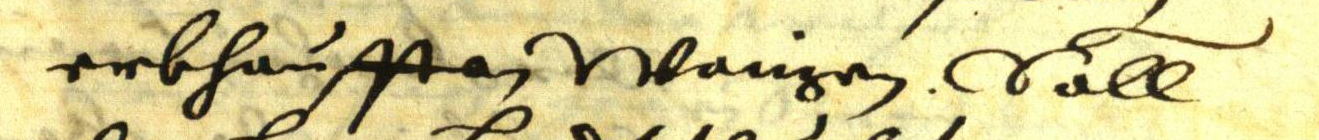erkhaūfften Waizen. Soll
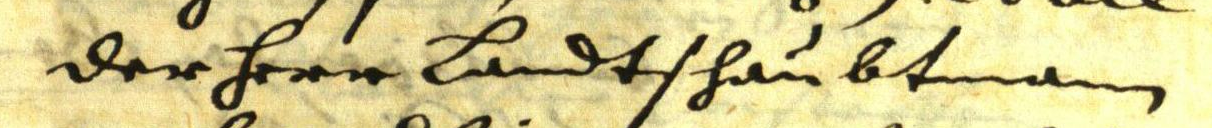der herr Landtshaūbtmann
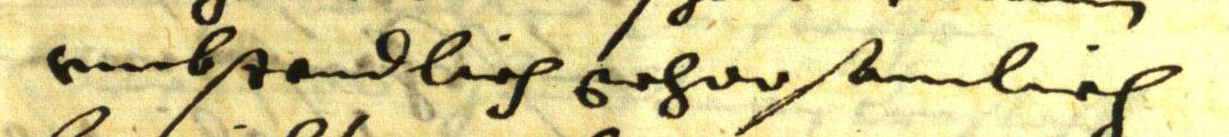vmbstendlich gehorsamlich
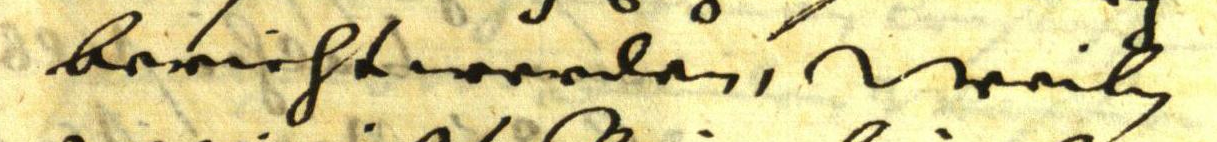bericht werden, Weiln
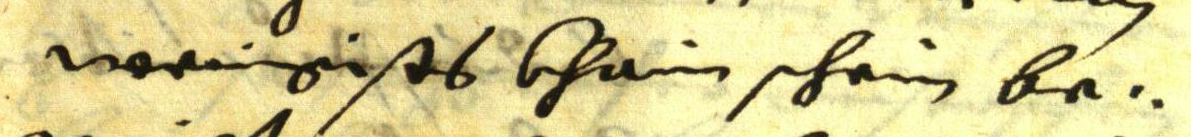wenigists khain schein be¬
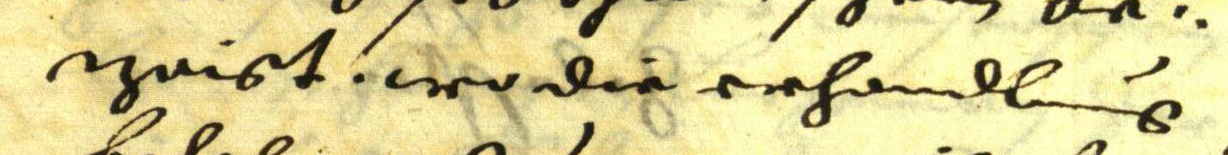zaigt. wo die erhandlūng
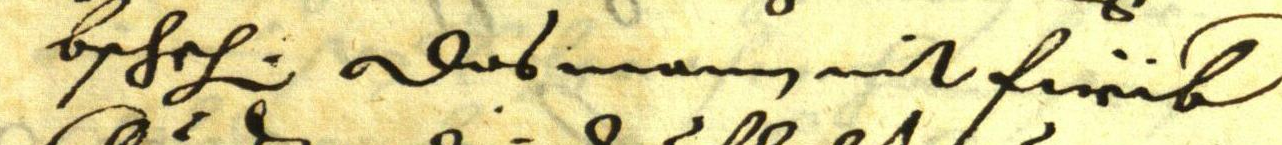bscheh. Das mann nit firib
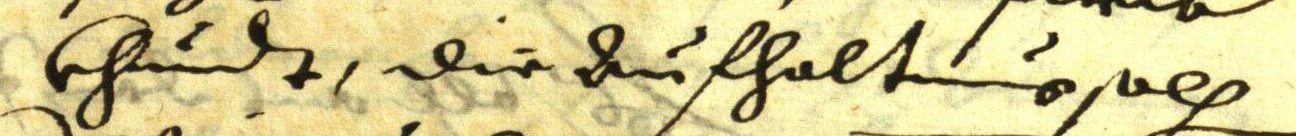khūndt, die Aūfhaltūng solh
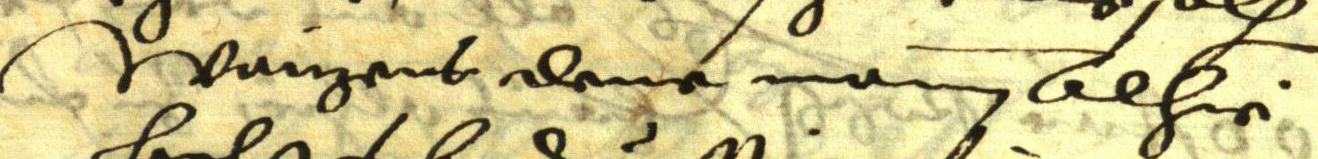Waizens deme mann Alhie
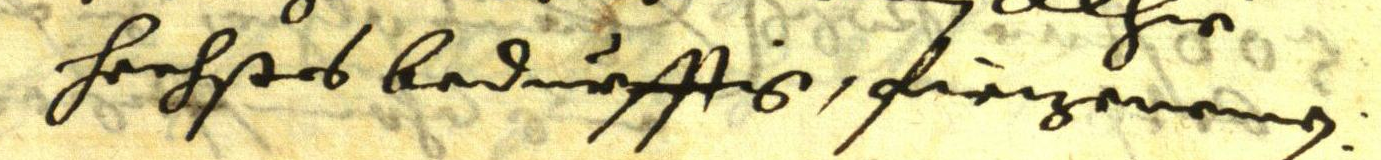hechstes bedūrfftig firzenemen.
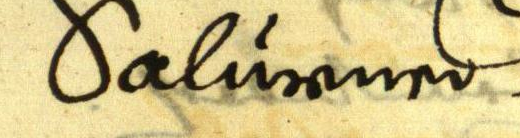Salūrner.
